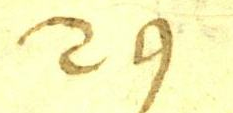29
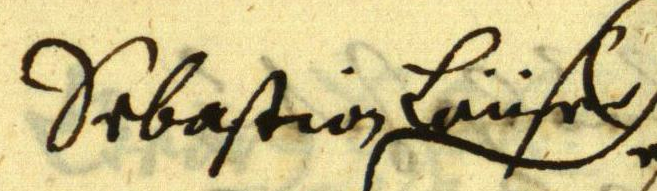Sebastian Länser.
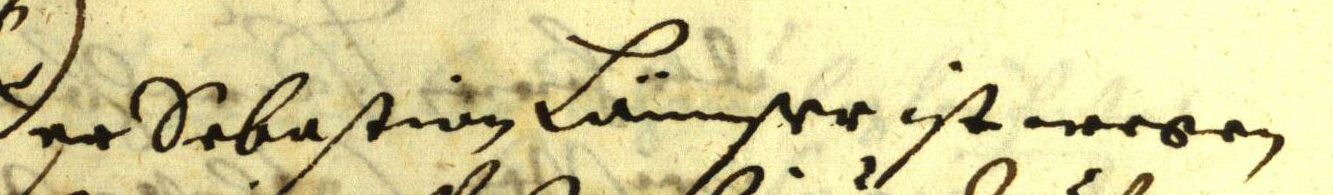Der Sebastian Lännser ist wegen
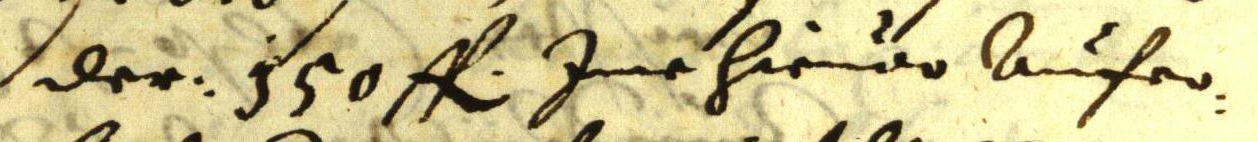der: 150 fl. Ime hieor Aūfer¬
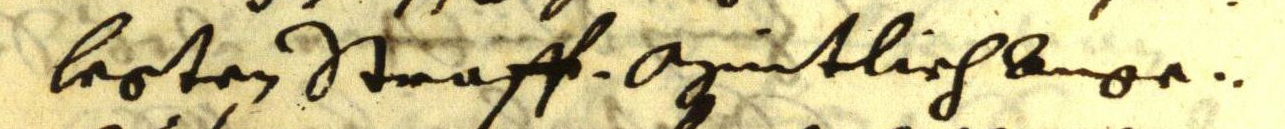legten Straff. Mintlich ange¬
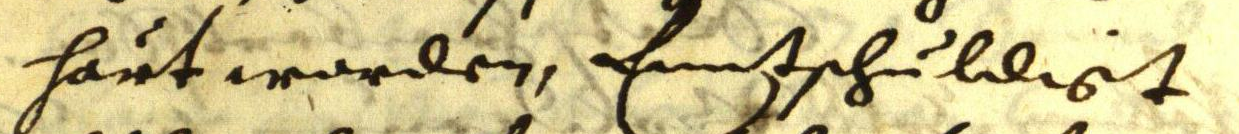hōrt worden. Enntschūldigt
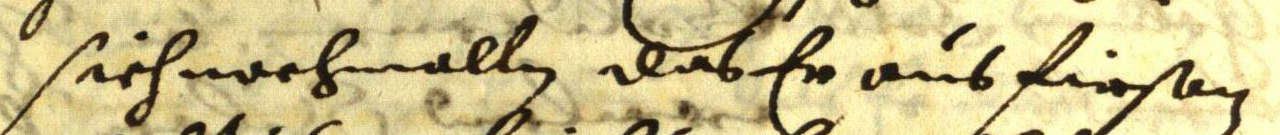sich nochmalln das Er aūs firsaz
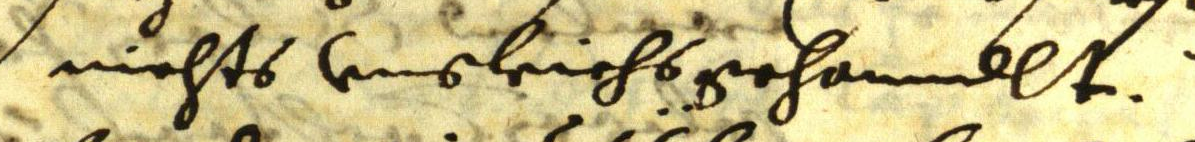nichts vngleichs gehanndlt.
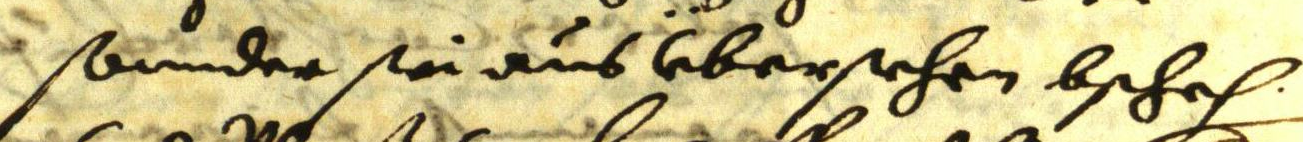sonnder sei aūs v̈bersehen bscheh
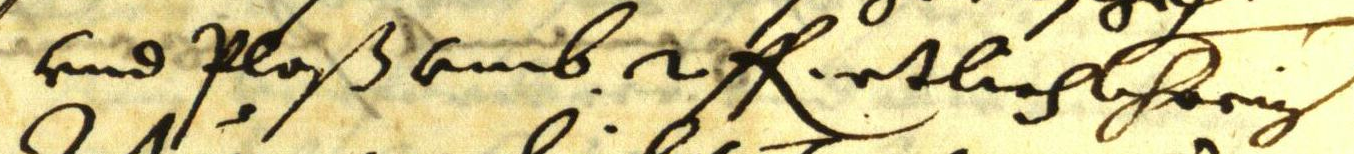vnd Ploß umb. 2 fl. etlich khreiz
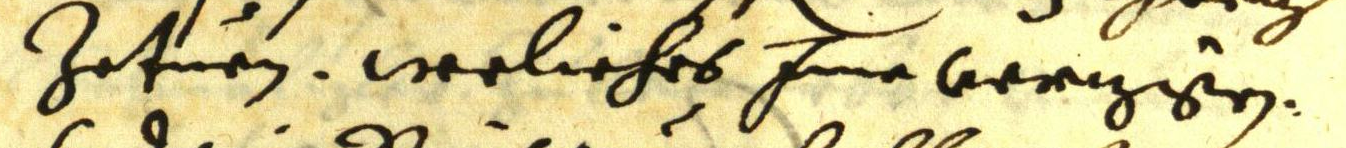Zetūen. weliches Ime verzigen.
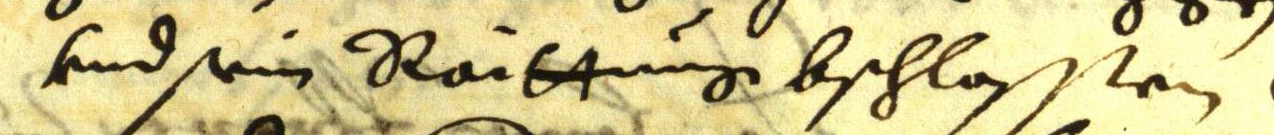vnd sein Raittūng beschlossen
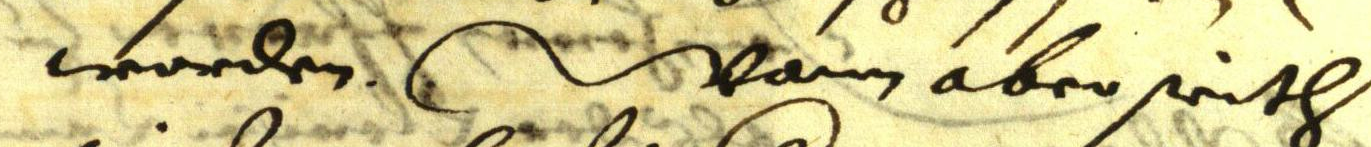worden. Wann aber seith
